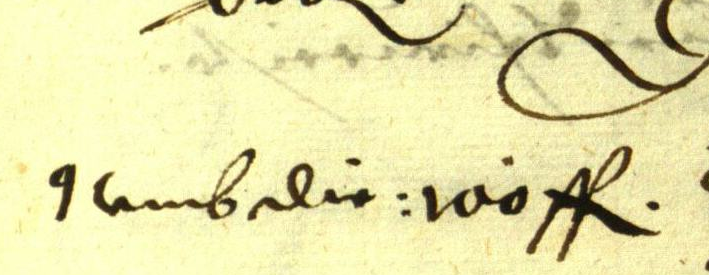umb die: 100 fl.
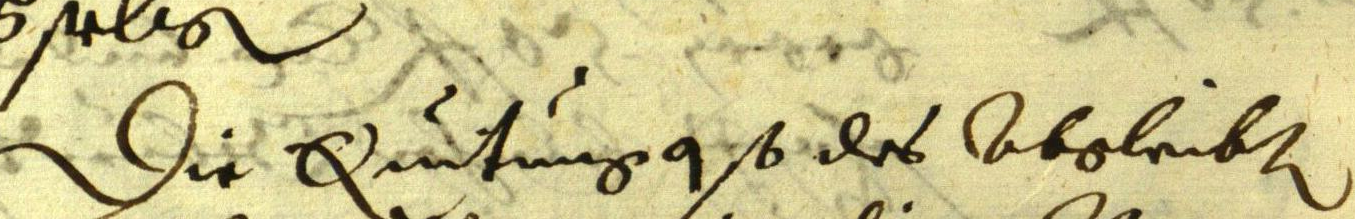Die Qūitūng so des Abgleibt
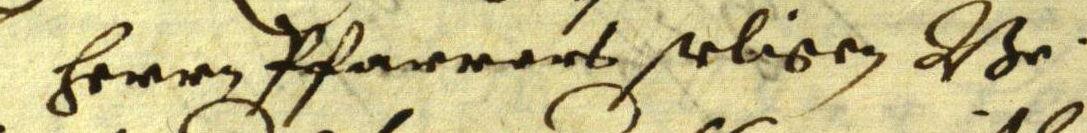herrn Pfarrers seligen Be¬
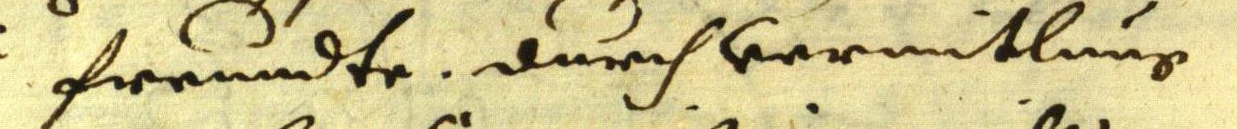freūndte. durch vermitlūng
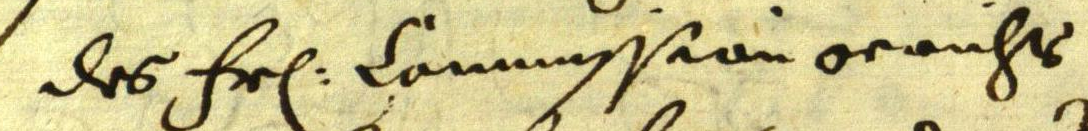des Frl: Commission gerichts.
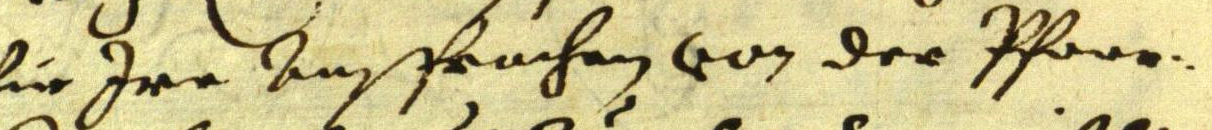fir Ire AnsPrachen von der Pfarr¬
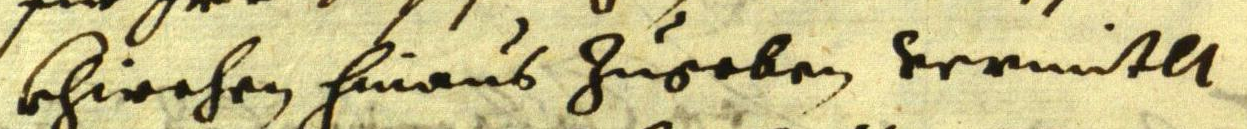khirchen hinaūs Zugeben vermitlt
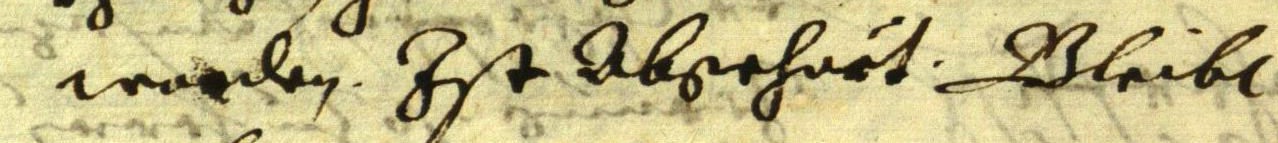worden. Ist Abgehōrt. Bleibt
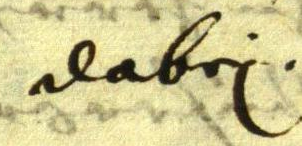dabej.
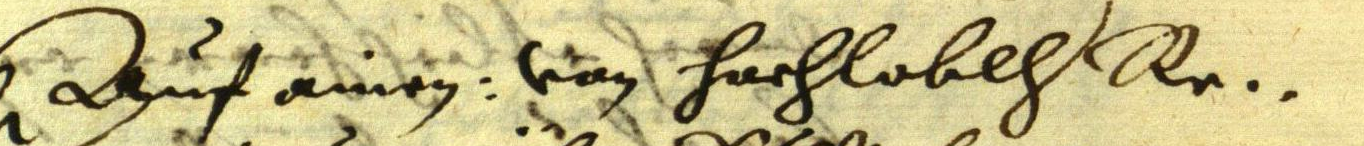Aūf ainen: von hochloblich Re¬
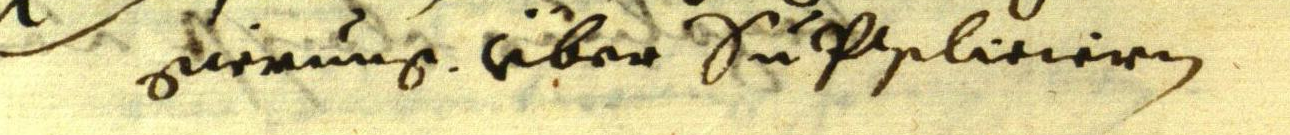gierūng. über SūPpliciern
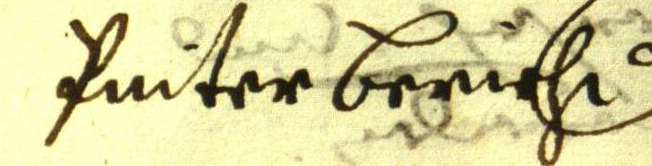Pinter bericht
